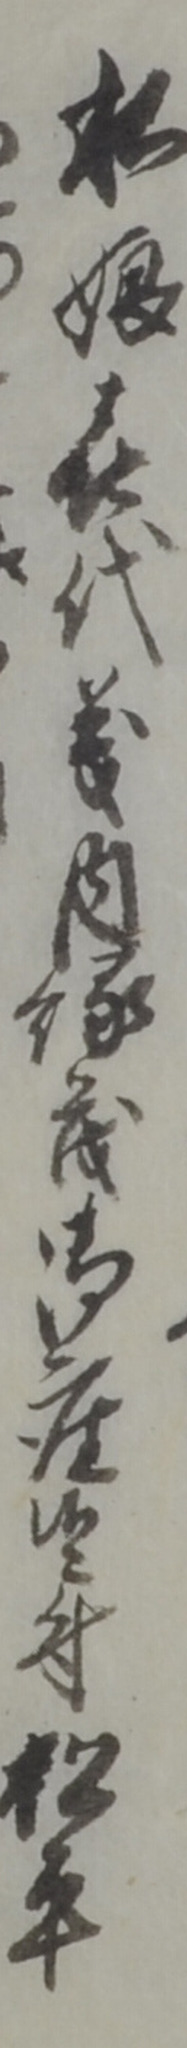私娘喜代義内縁も御座候ニ付松平
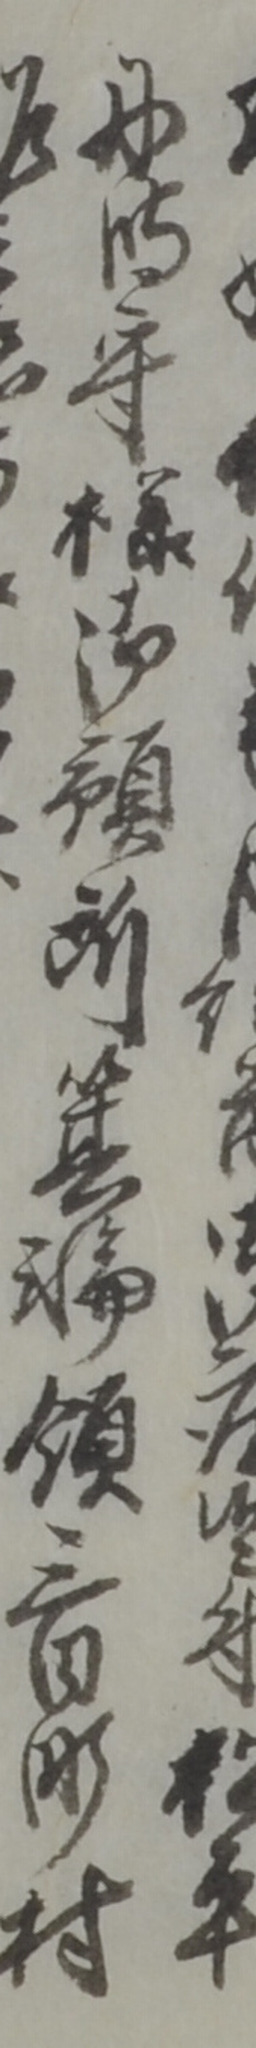丹波守様御預所箕輪領三日町村
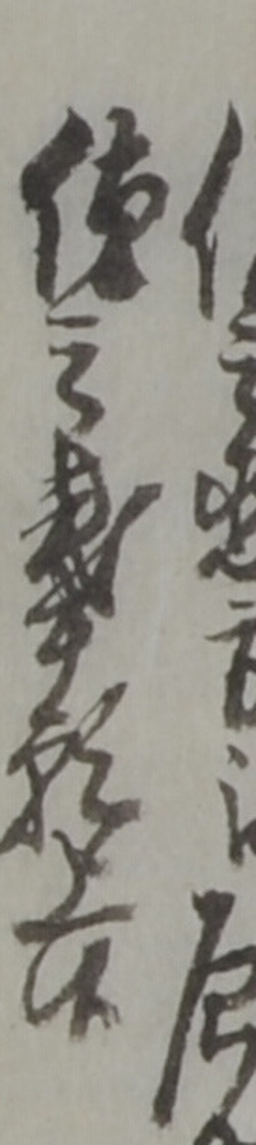依之奉願上候
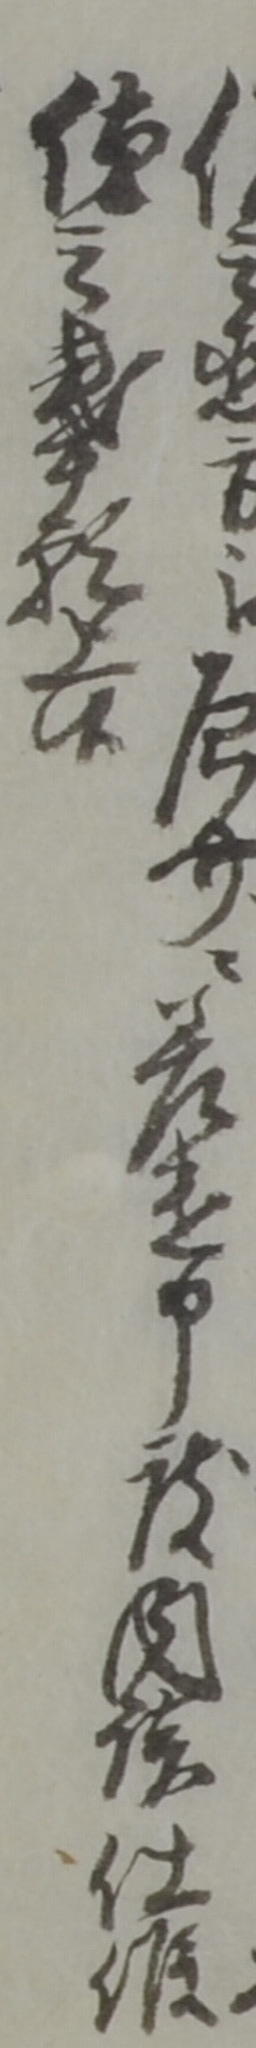依之奉願上候
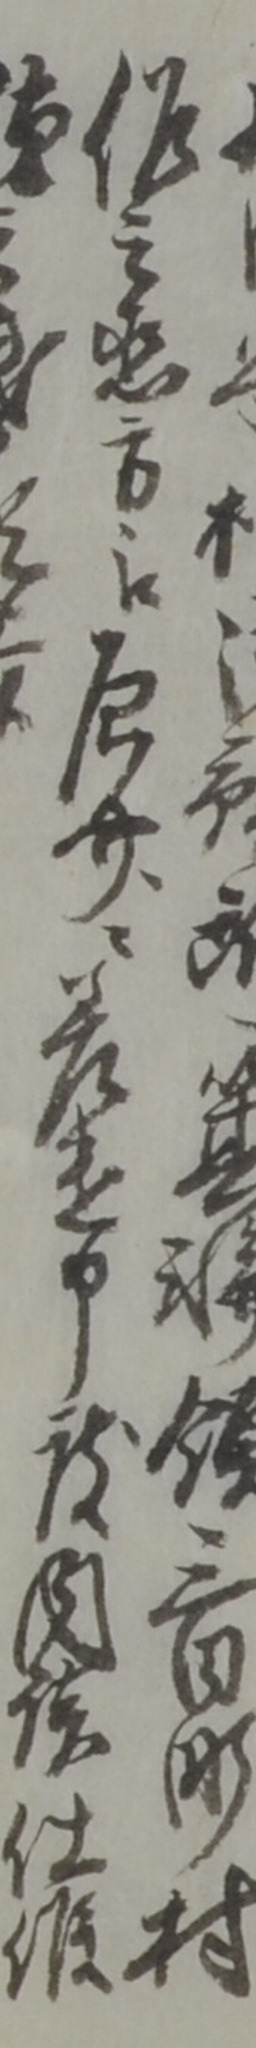作之丞方江厄介ニ差遣申度内談仕候
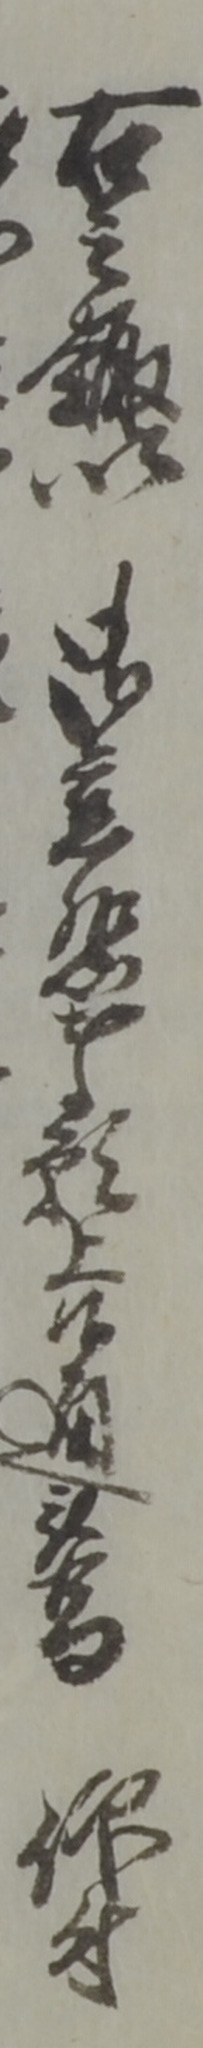右之趣以御慈悲奉願上候通被為仰付
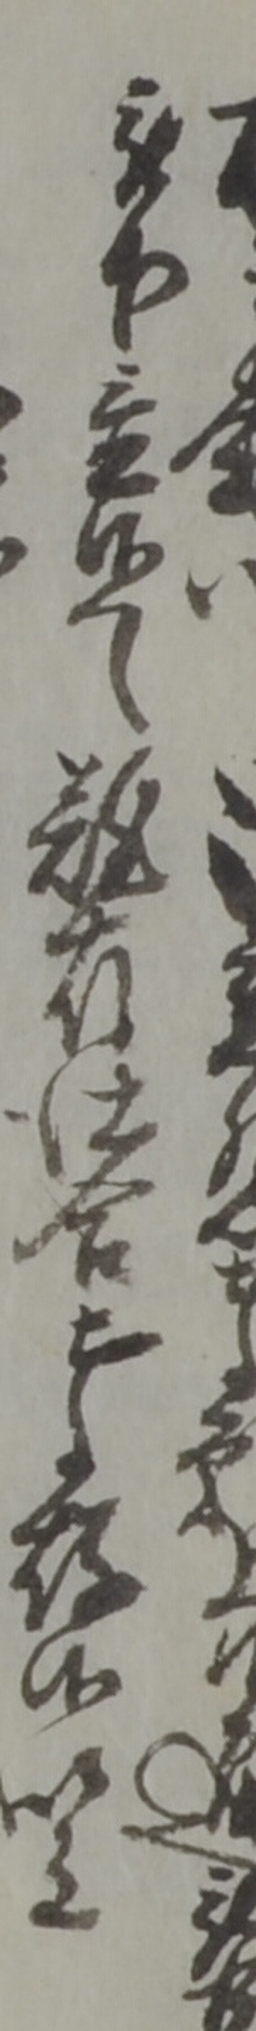被下置候ハヽ難有仕合奉存候以上
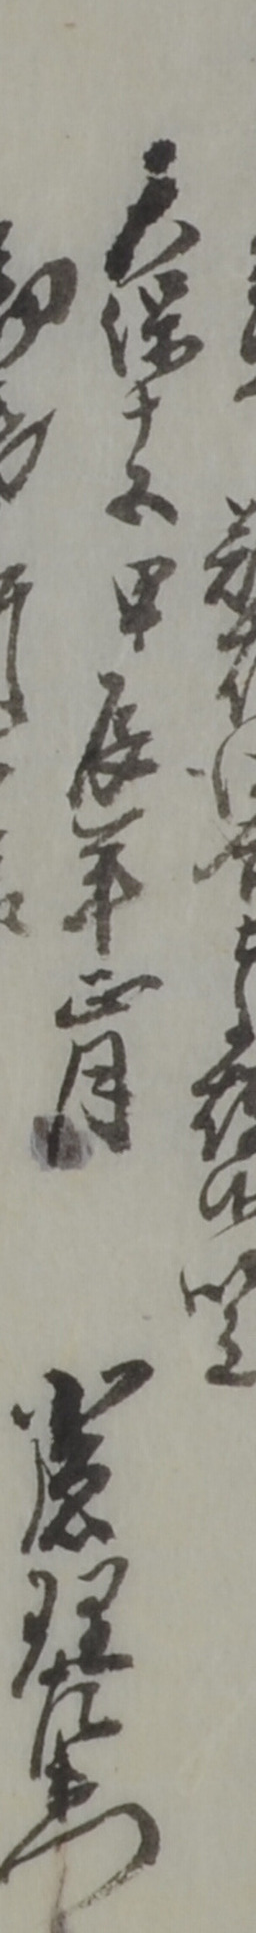天保十五甲辰年正月北原理左衛門
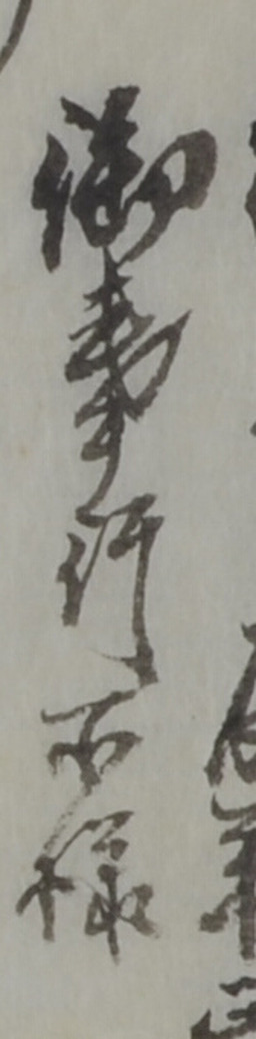御奉行所様
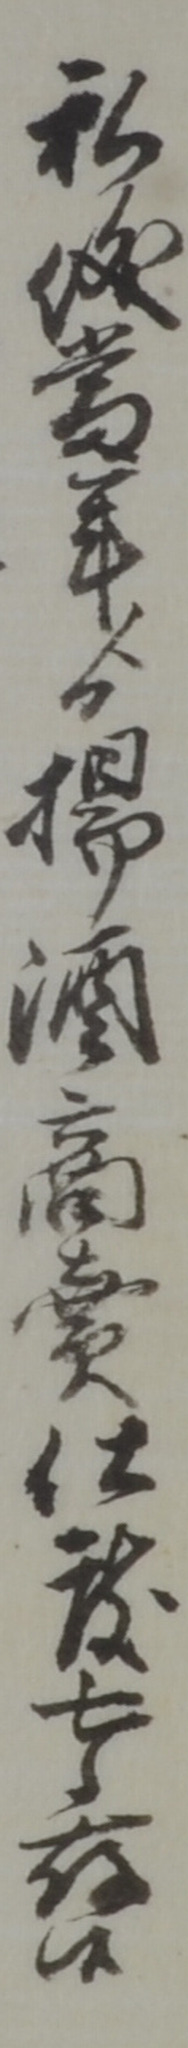私儀当年ゟ揚酒商売仕度奉存候
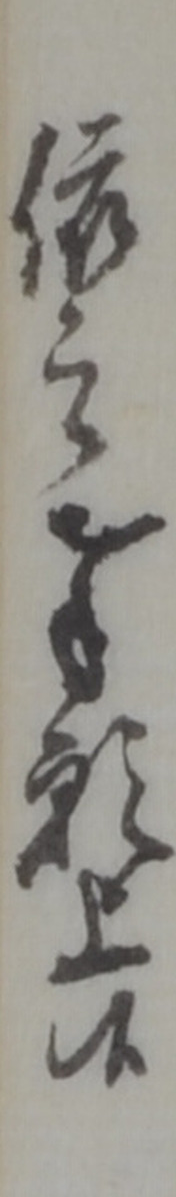依之奉願上候
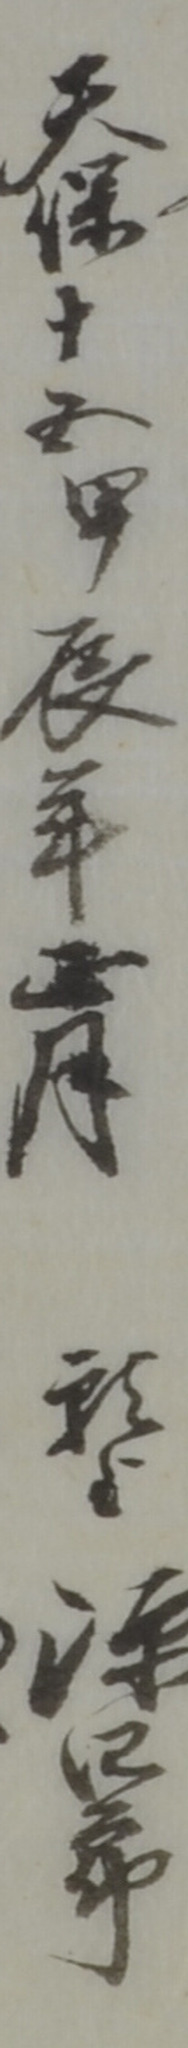天保十五甲辰年正月願主源四郎
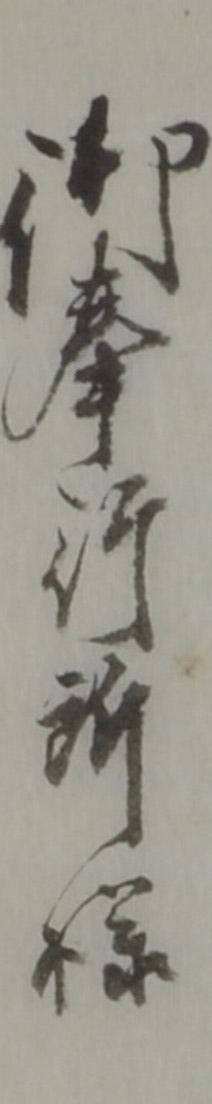御奉行所様
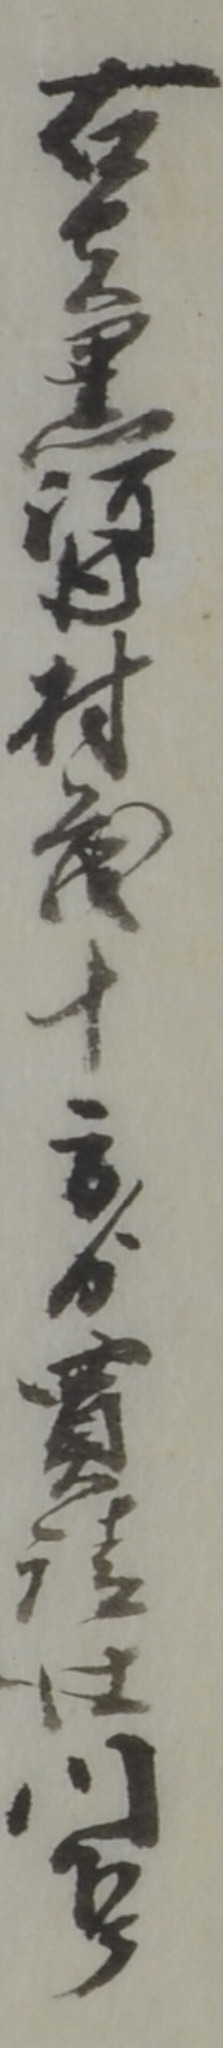右者黒河内村茂十方ゟ買請仕川下ヶ
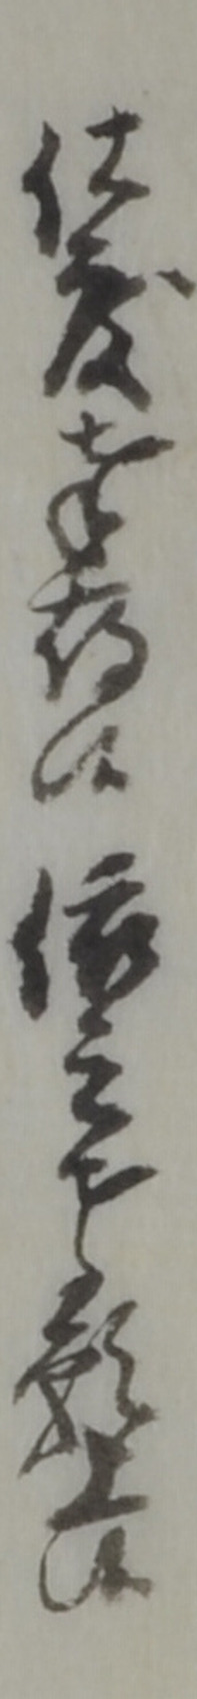仕度奉存候依之奉願上候新町
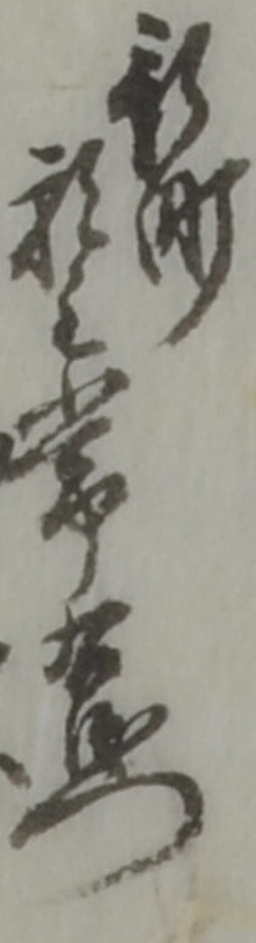願主常右衛門
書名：諸願書控簿
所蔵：伊那市立高遠町図書館・合同会社AMANE
